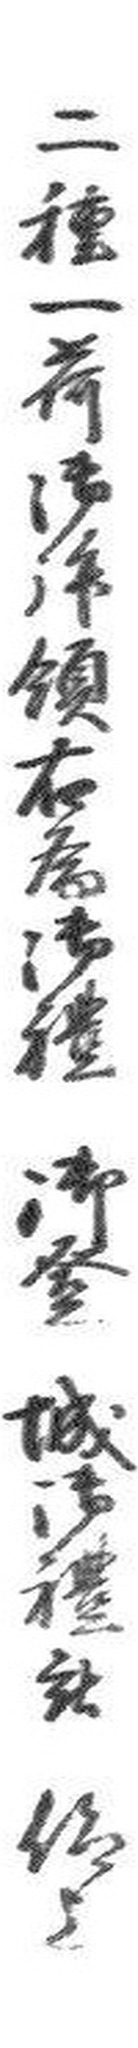二種一荷御拝領右為御礼御登城御礼被仰上
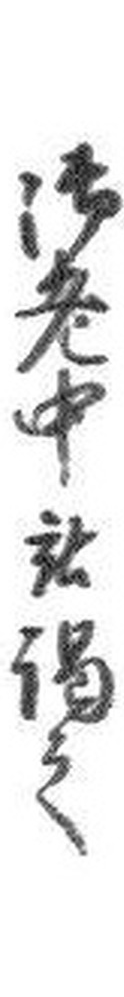御老中被謁之
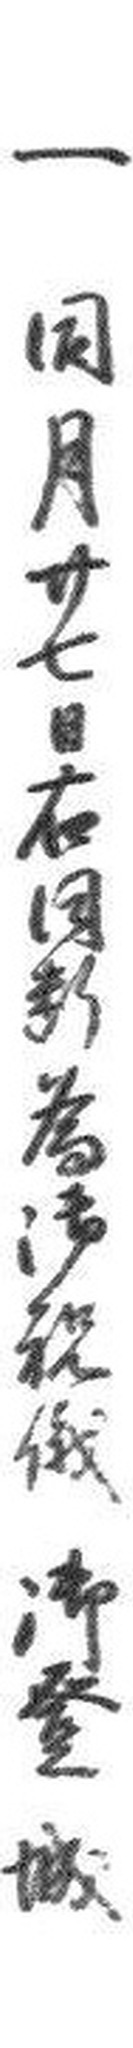一同月廿七日右同断為御祝儀御登城
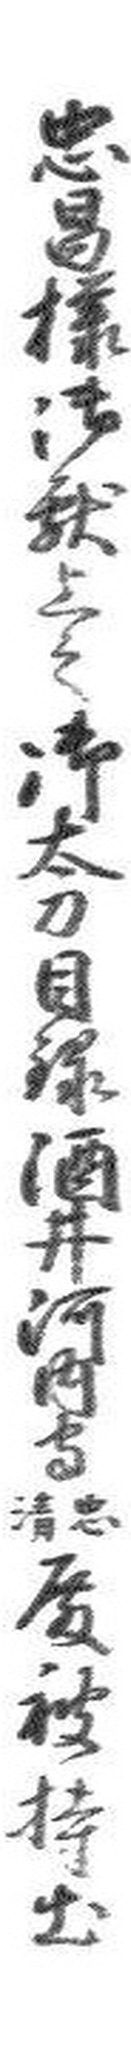忠昌様御献上之御太刀目録酒井河内守忠清殿被持出
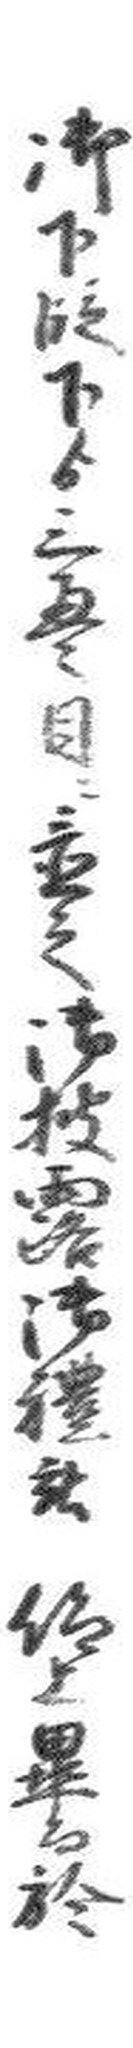御下段下ゟ三畳目ニ置之御披露御礼被仰上畢而於
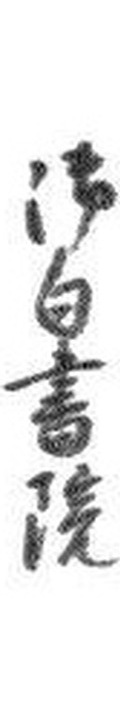御白書院
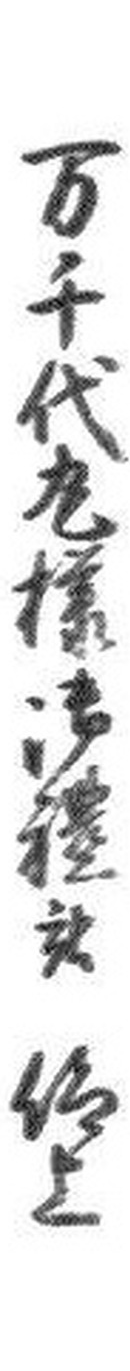万千代丸様御礼被仰上
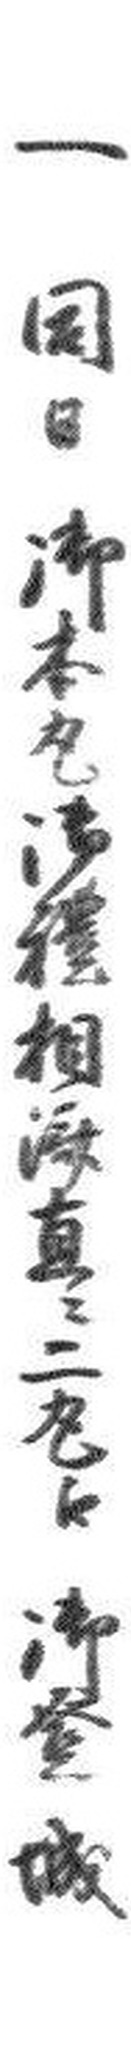一同日御本丸御礼相済直ニ二丸江御登城

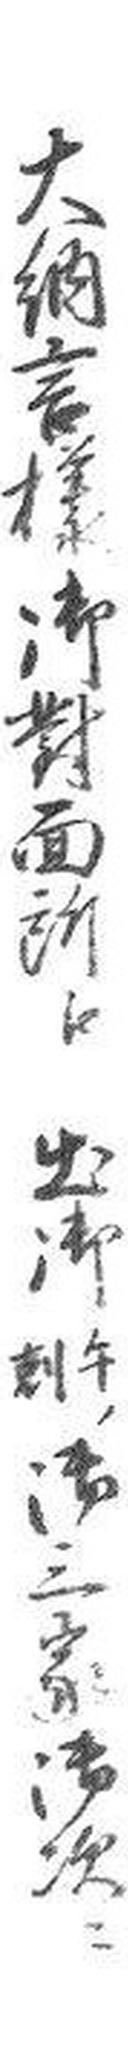大納言様御対面所江出御午ノ刻御三家御次ニ
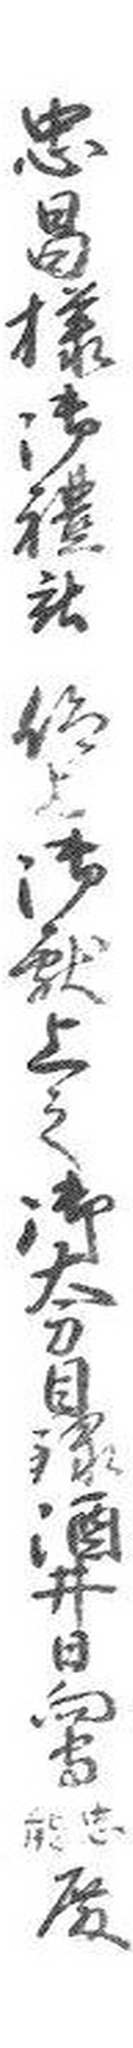忠昌様御礼被仰上御献上之御太刀目録酒井日向守忠能殿
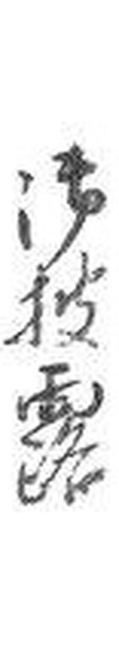御披露
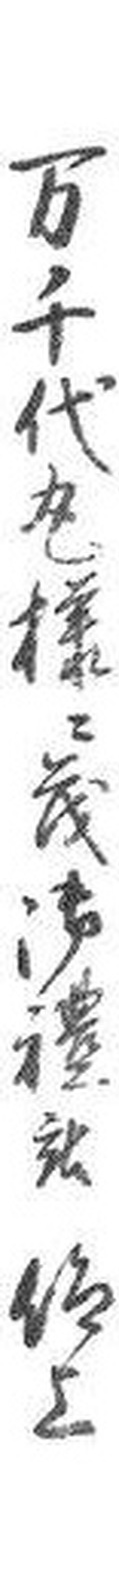万千代丸様ニ茂御礼被仰上
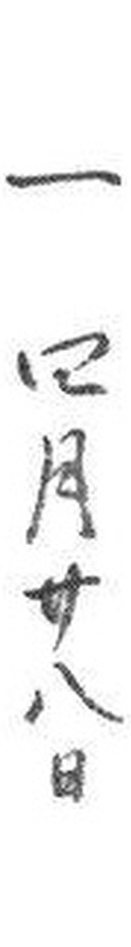一四月廿八日
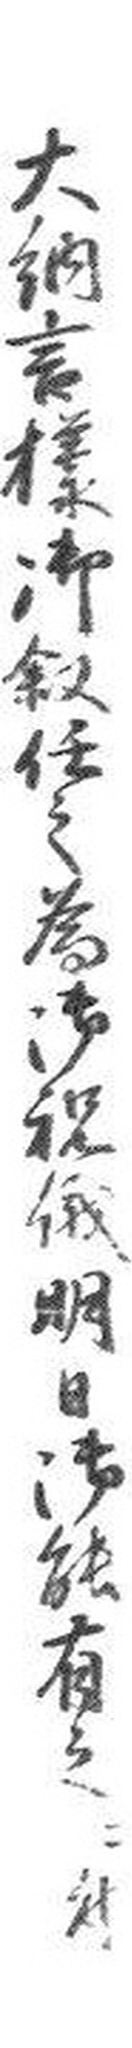大納言様御叙任之為御祝儀明日御能有之ニ付
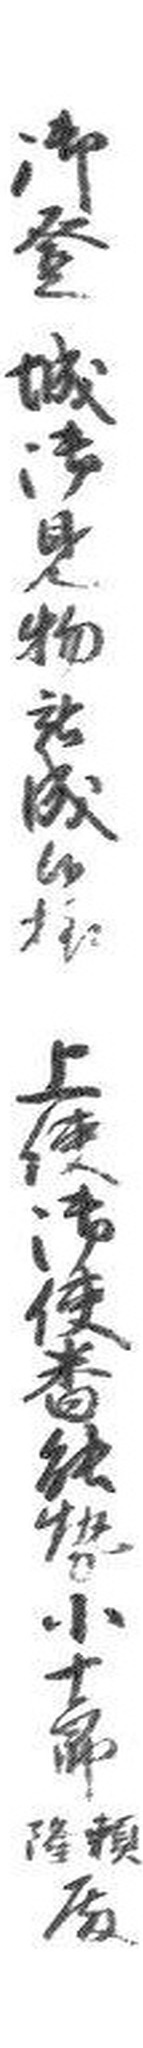御登城御見物被成候様上使御使番能勢小十郎頼隆殿
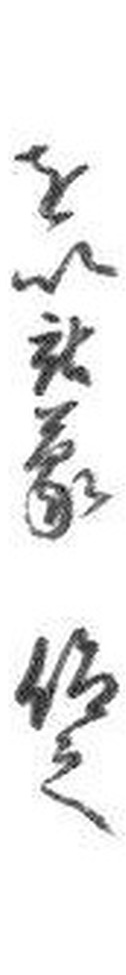を以被蒙仰之
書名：家譜 四 忠昌公 従寛永七年到正保四年
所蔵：福井県文書館 Fukui Prefectural Archives
